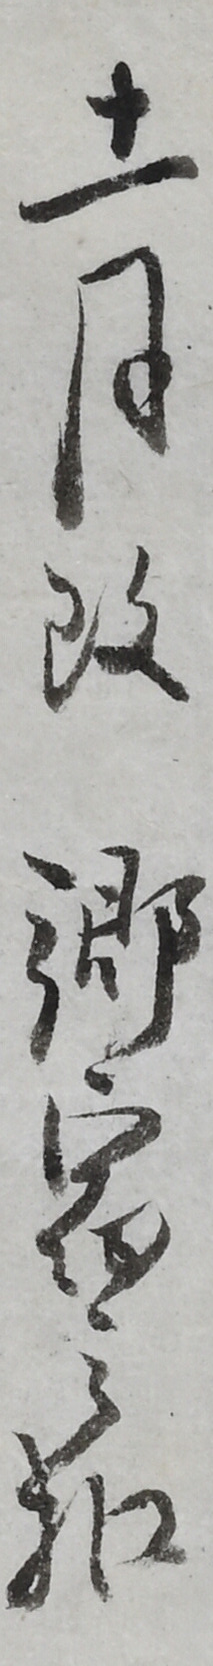十一月改郷宿之扣
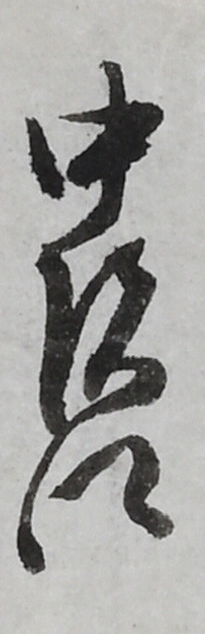中沢郷
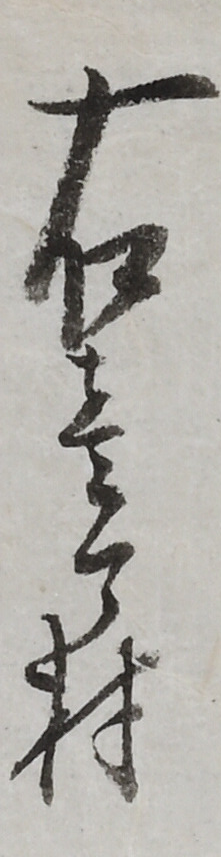右壱ヶ村
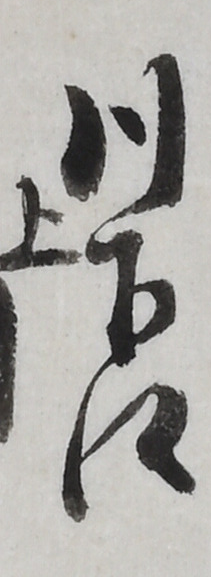川下郷
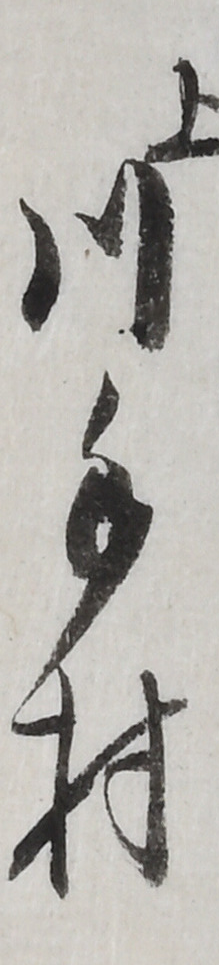川手村
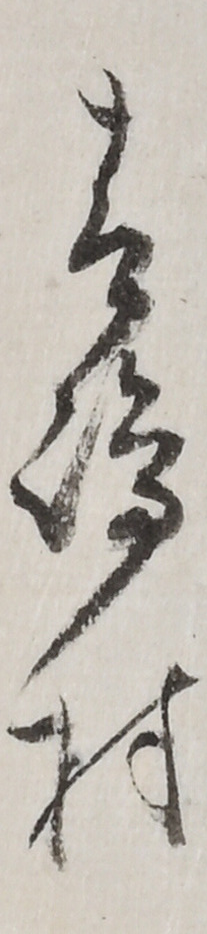青嶋村
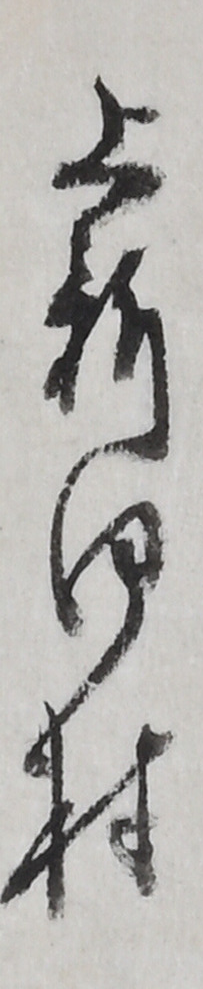上新田村
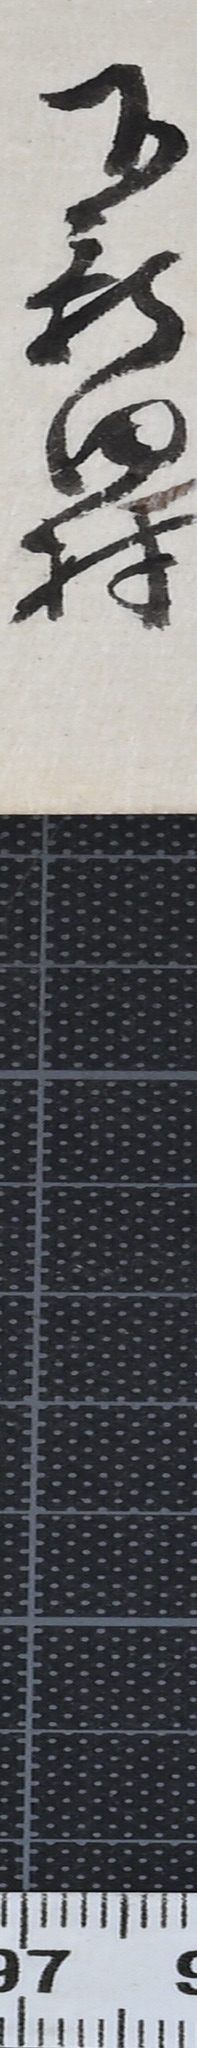下新田村
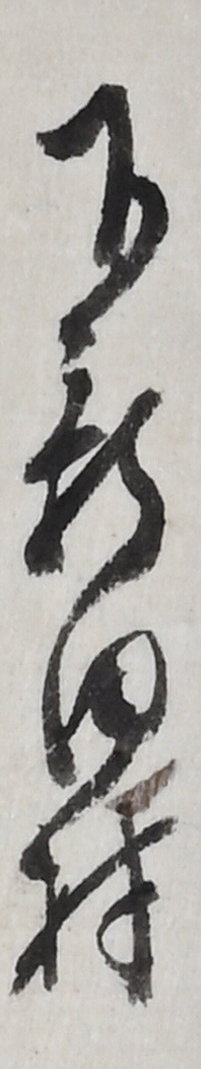下新田村
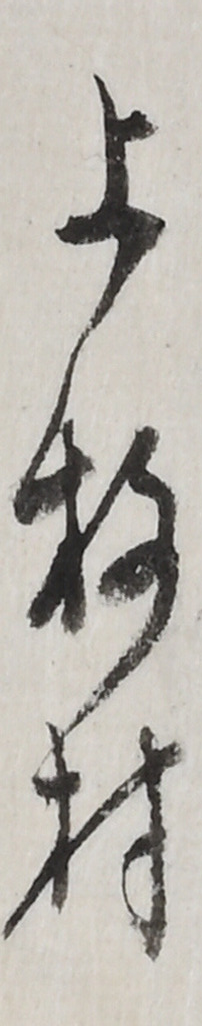上牧村
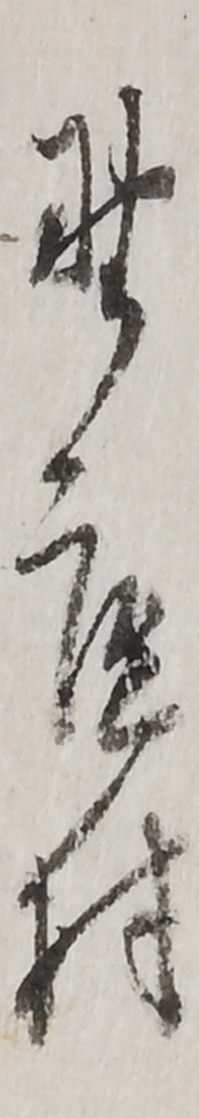野底村
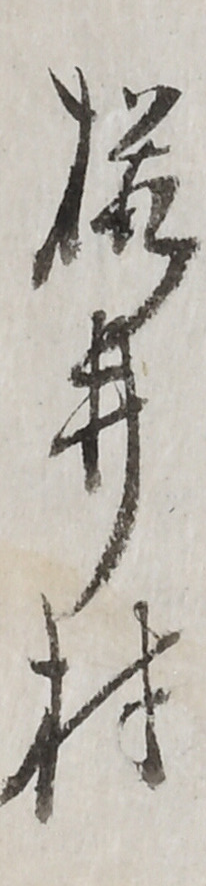桜井村
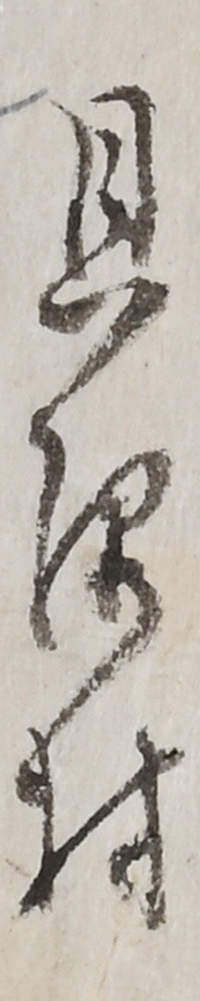貝沼村
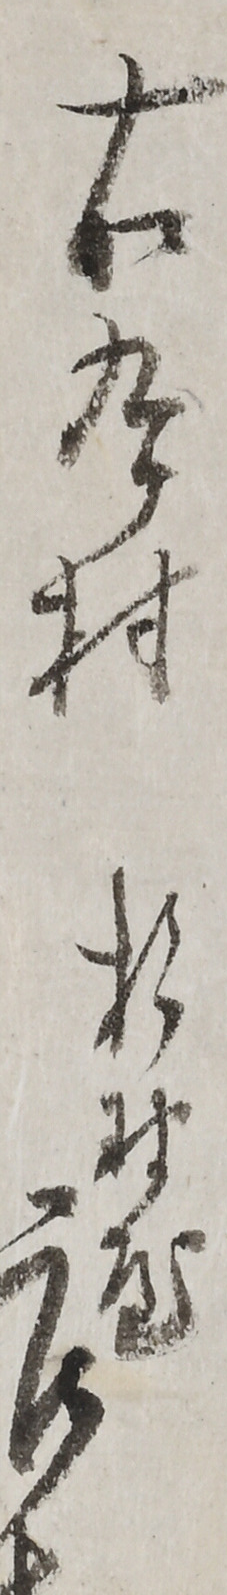右九ヶ村松村屋
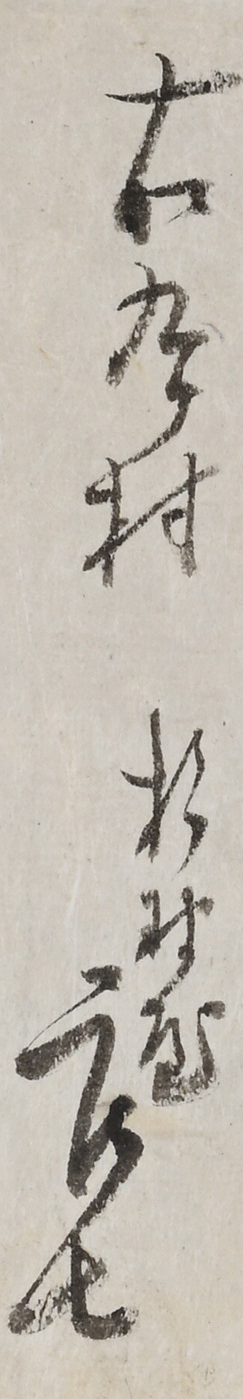右九ヶ村松村屋
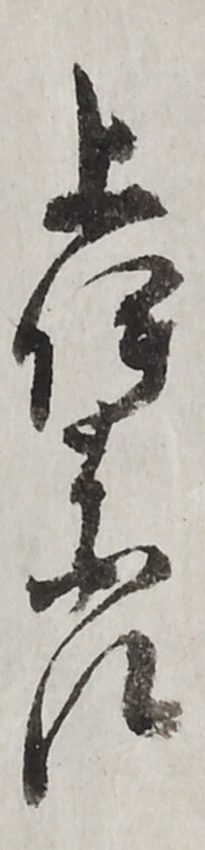上伊奈郷
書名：年内行事帳
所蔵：伊那市立高遠町図書館・合同会社AMANE
